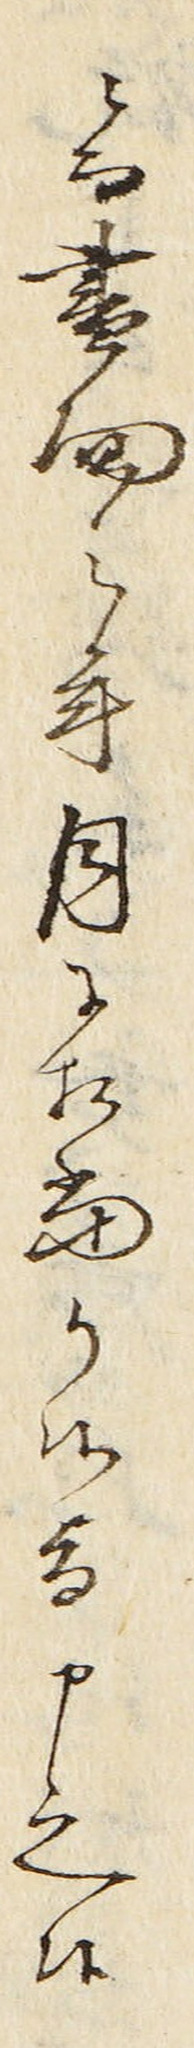に而書面之年月に相当り候旨申之候
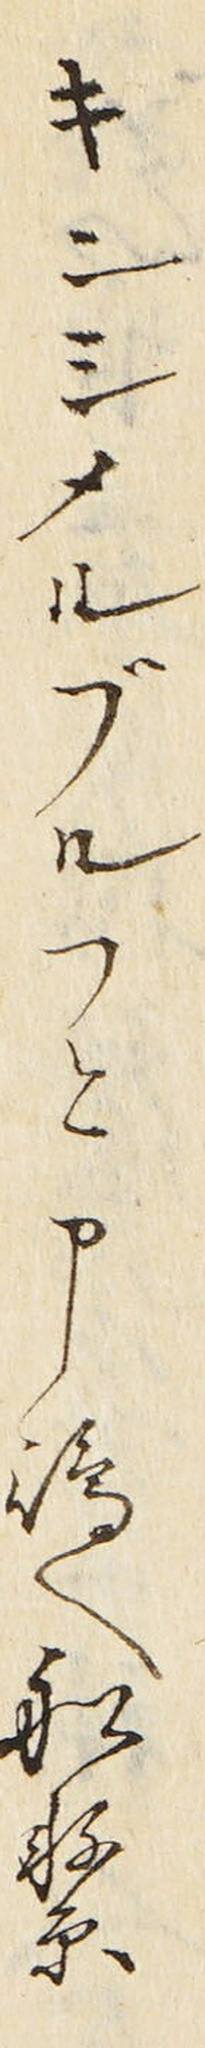キンシメンブルフと申嶋へ船繋
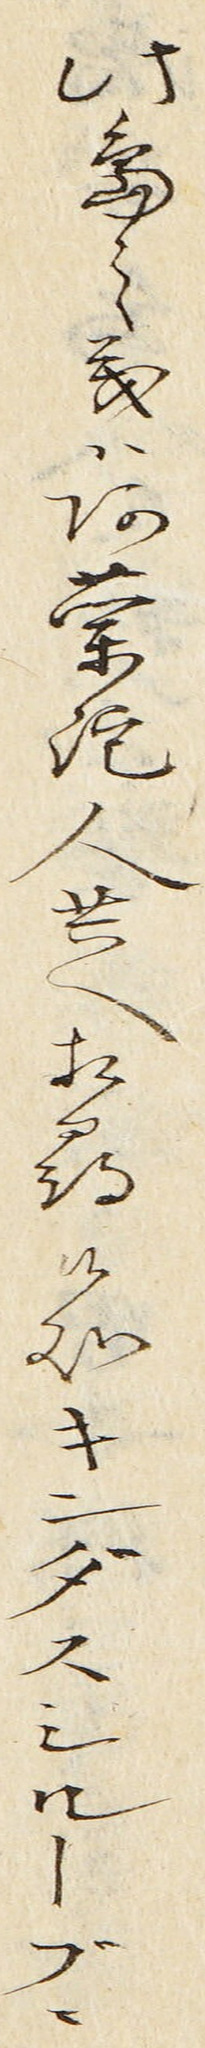此島之義は阿蘭陀人共へ相尋候処キンダスシルーブに
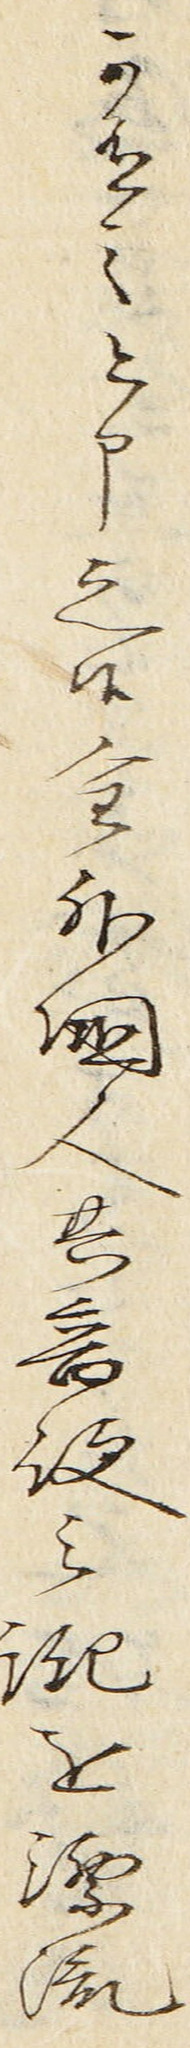可有之と申立候全外国人共音便之訛を漂流
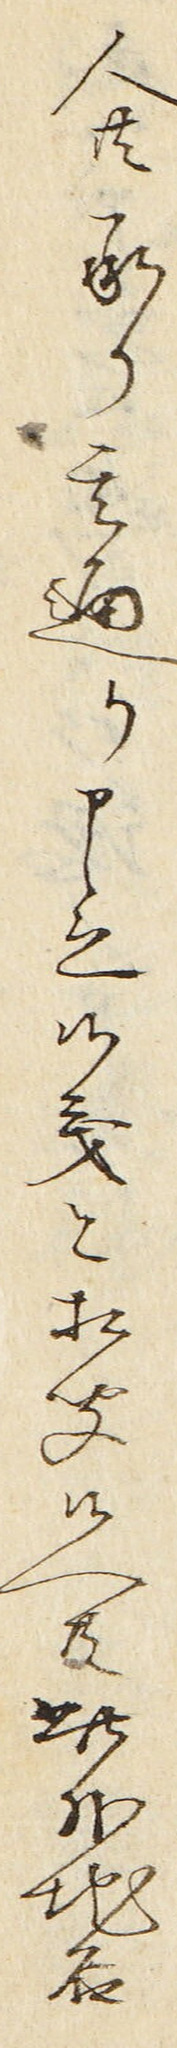人共承り其通り申立候義と相聞候へ共此外地名

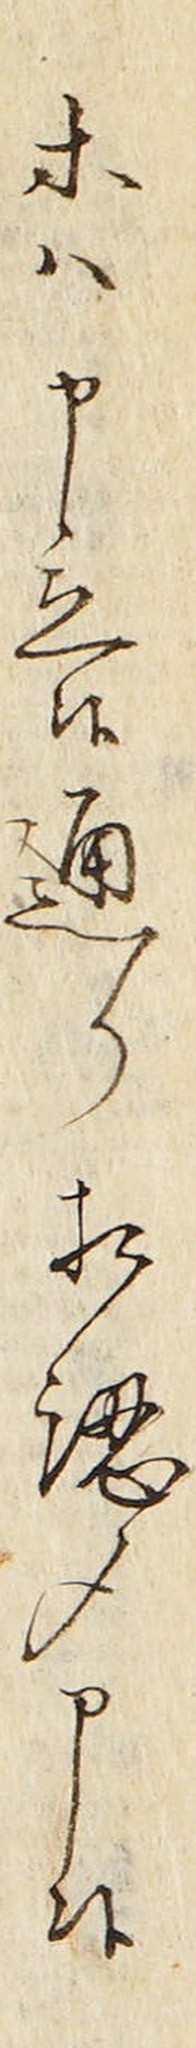等は申立候通り相認メ申候
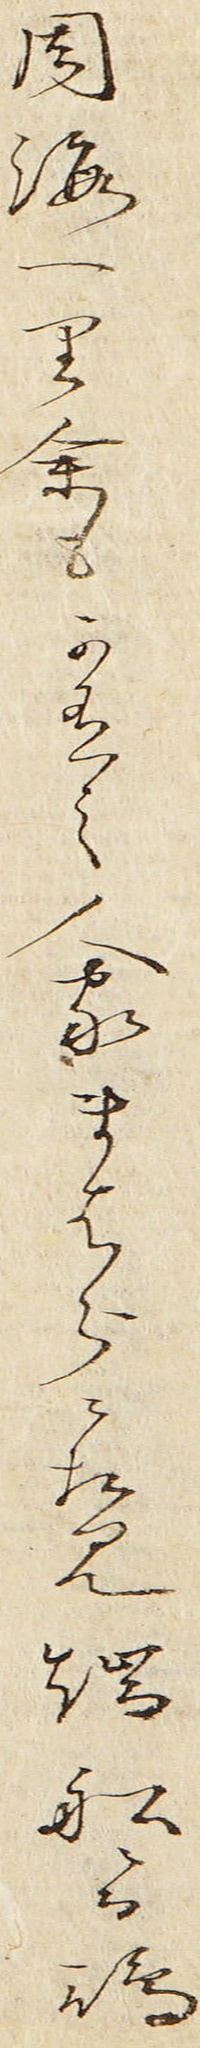周海一里余も可有之人家まはらに相見端船に而嶋
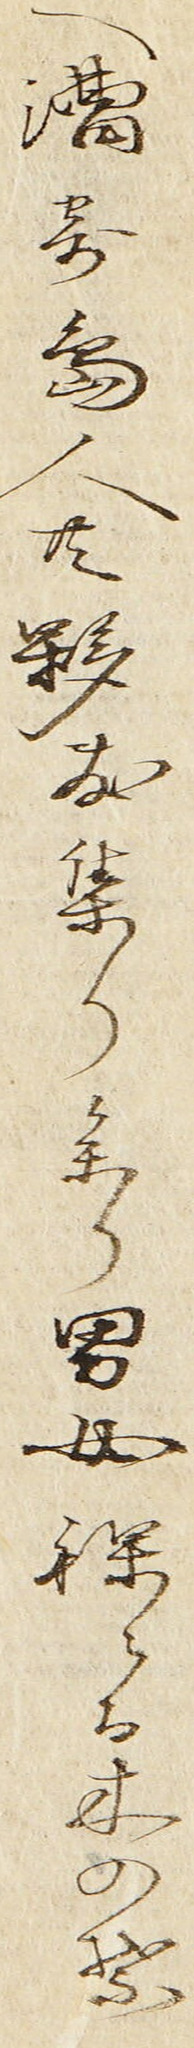へ漕寄島人共夥敷集り参り男女裸に而木の葉
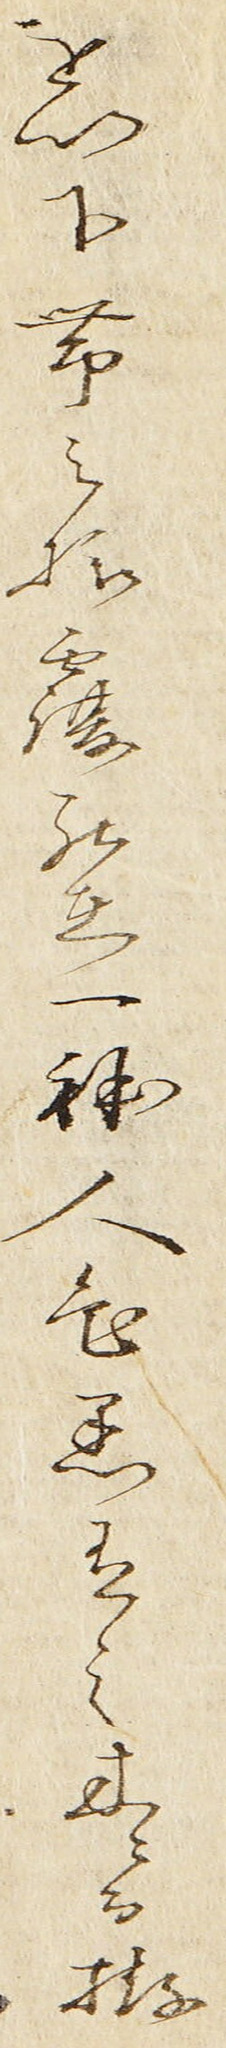を以下帯之様覆罷在一躰人色黒有之木に而拵
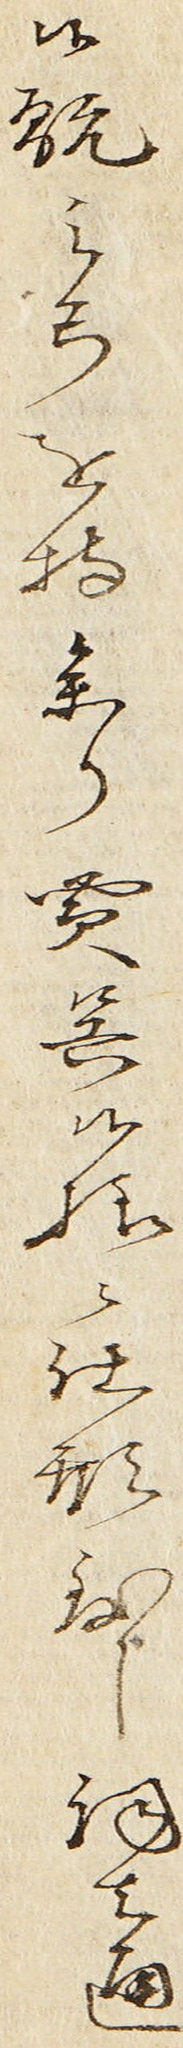候玩之弓を持参り買呉候様に仕形致し詞は通
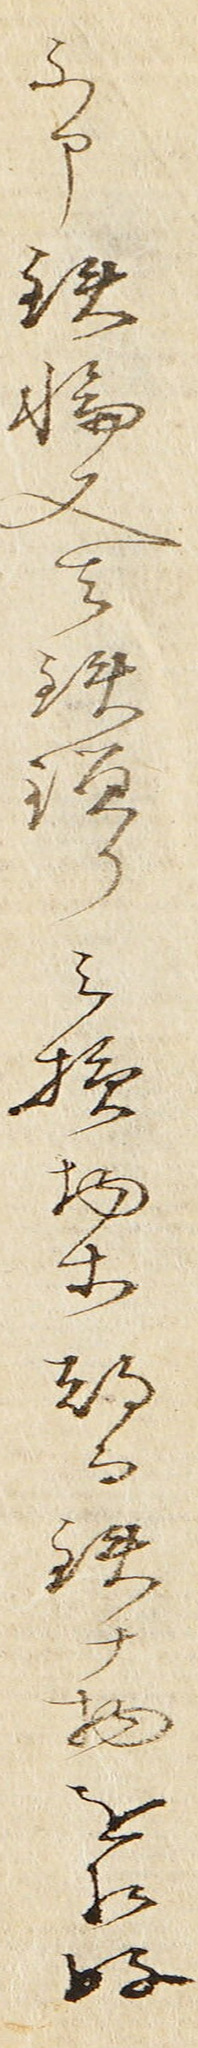不申鉄輪又は鉄鎖り之損物等都而鉄な物を相好
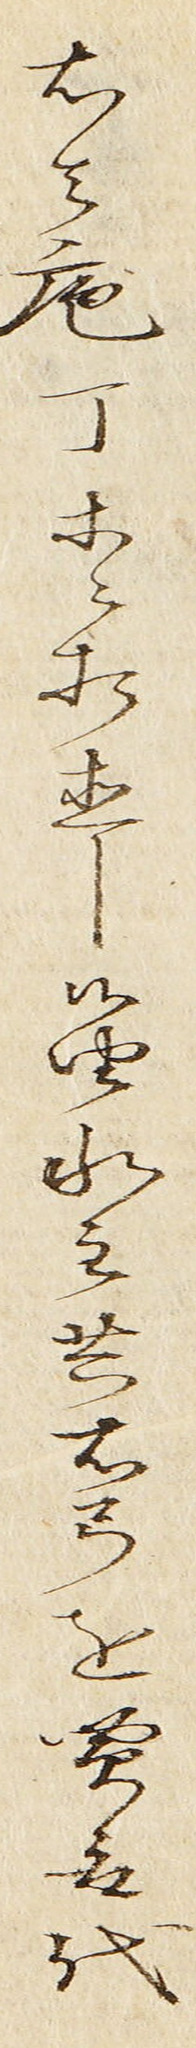右は庖丁等に相直し候由水主共右弓を買取代
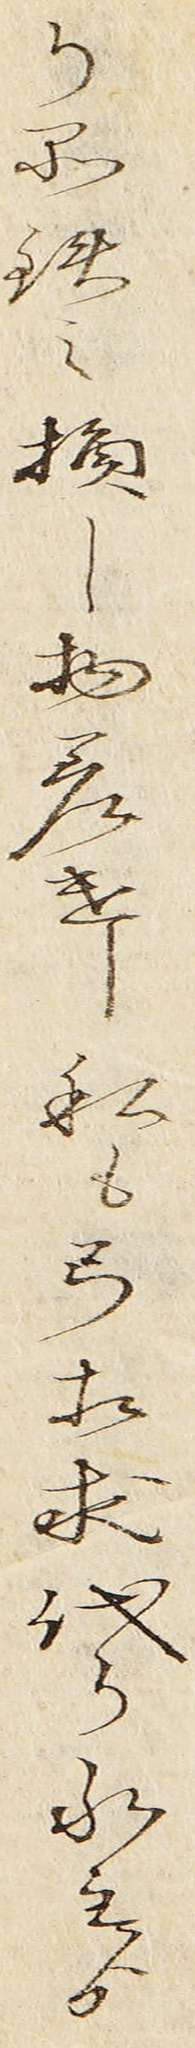り品鉄之損し物差遣し私も弓相求代り水主ゟ
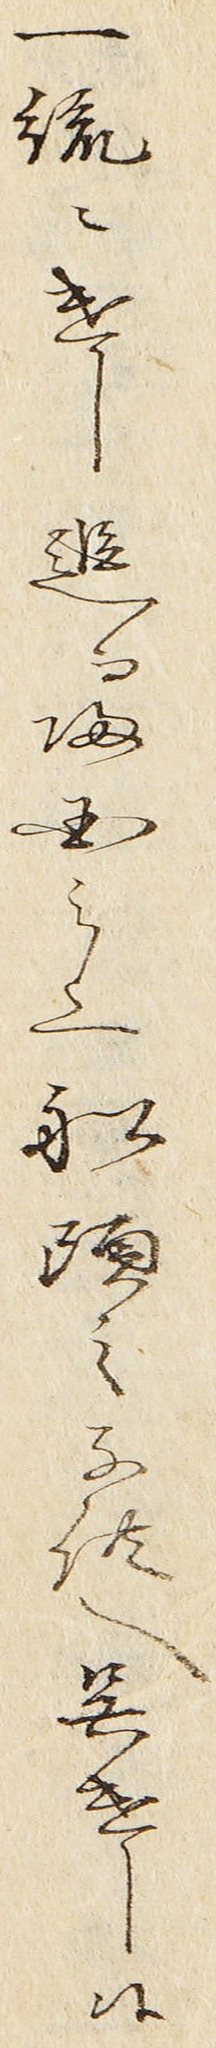一統に遣し追而帰国之上船頭之子供へ呉遣し候
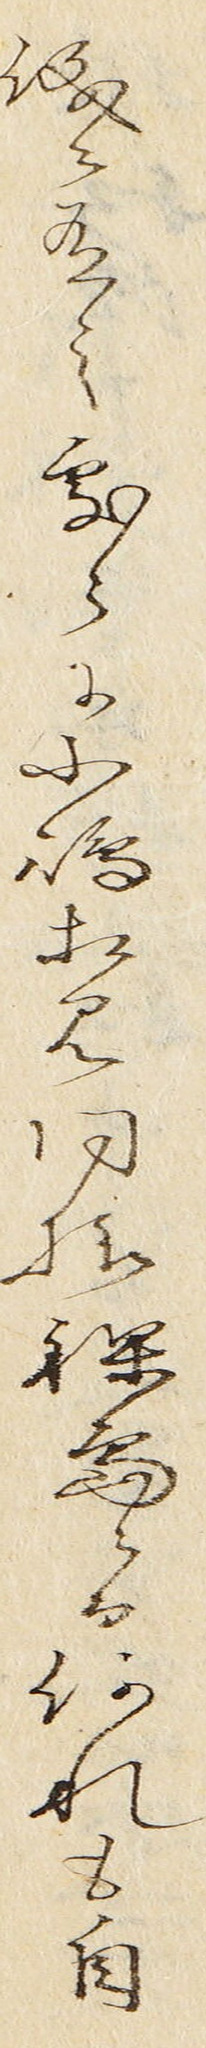儀に有之処々に小嶋相見同様裸島に而何れも自
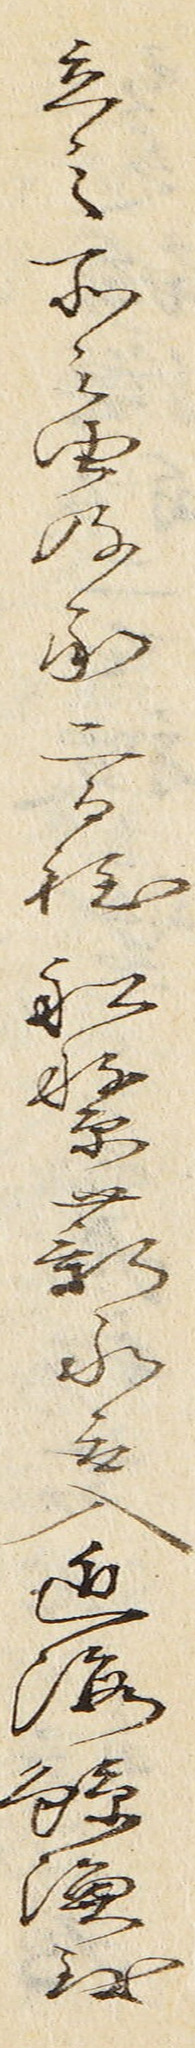立之所之由及承二日程船繋薪水取入近海鯨漁致
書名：土佐中浜万次郎漂流記
